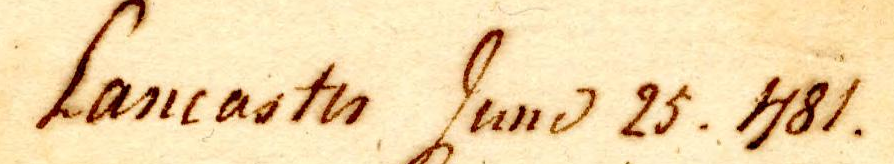Lancaster June 25 1781
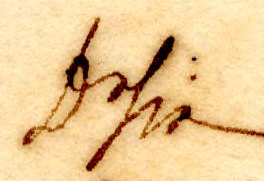D^r Sir
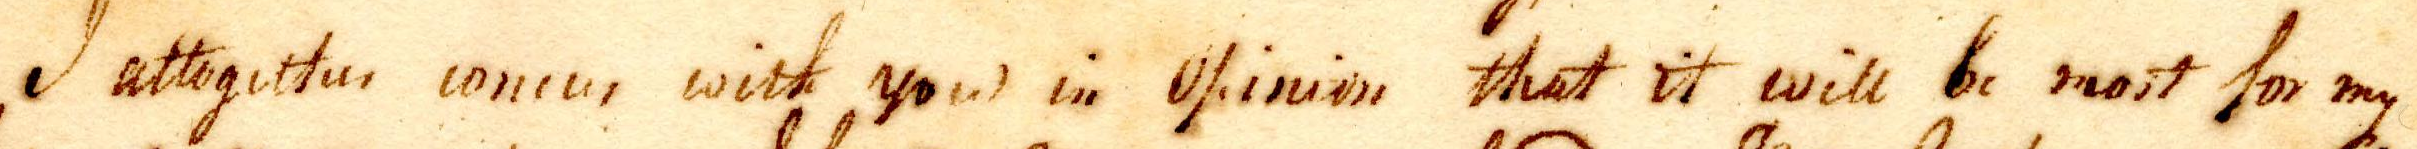I altogether concur with you in opinion that it will be most for my
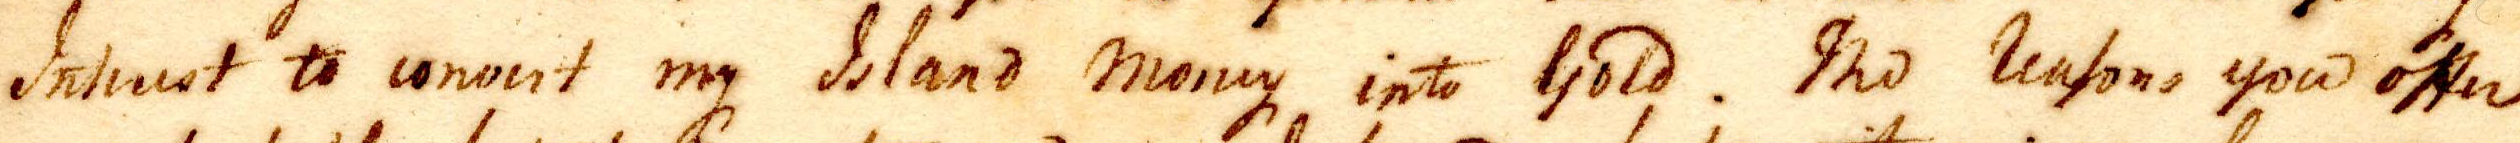Interest to convert my Island money into Gold. The Reasons you offer
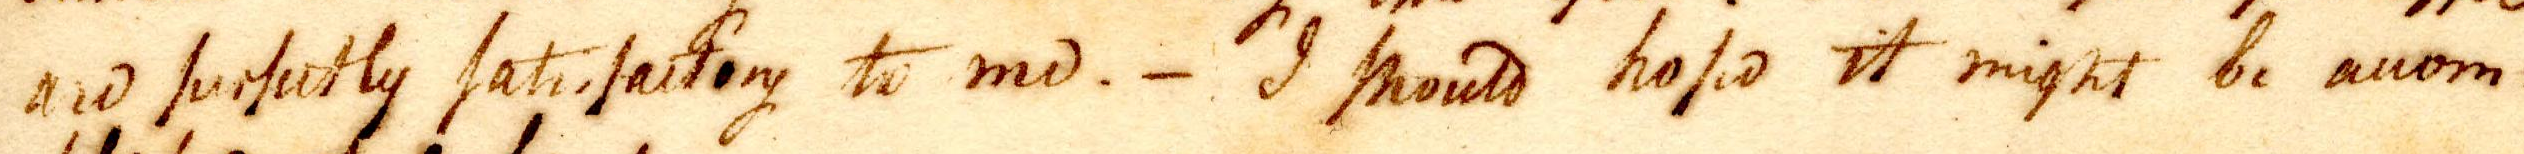ard perfectly satisfactory to me. I should hope it might be accom-
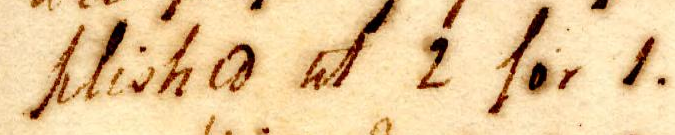-plished at 2 for 1.
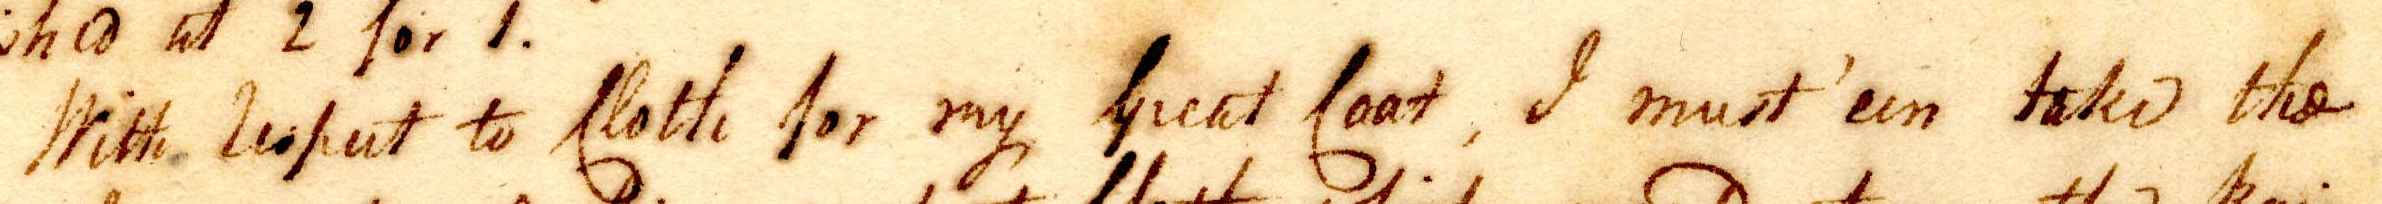With respect to Cloth for my Great Coat, I must' un take the
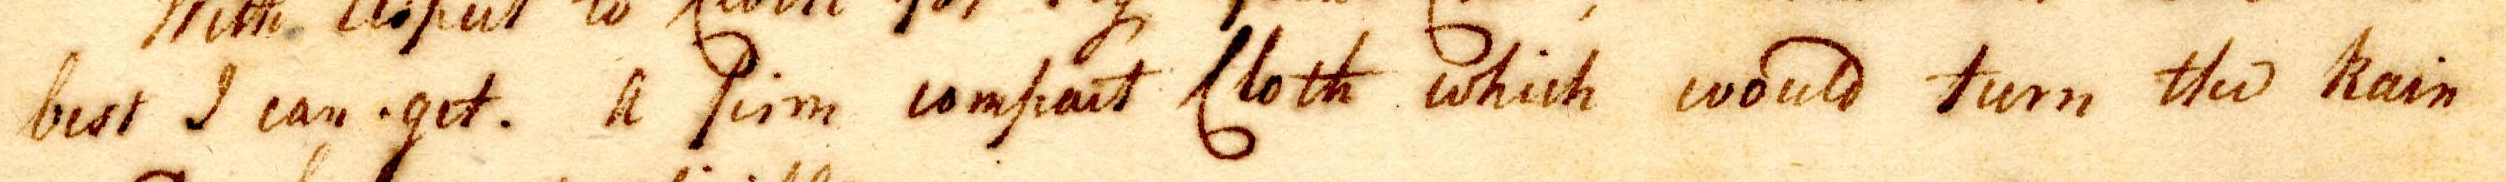best I can get. A firm compart Cloth which could turn the Rain
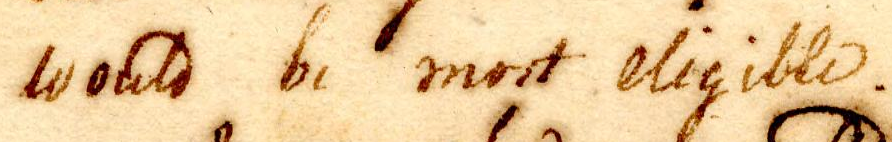would be most eligible.
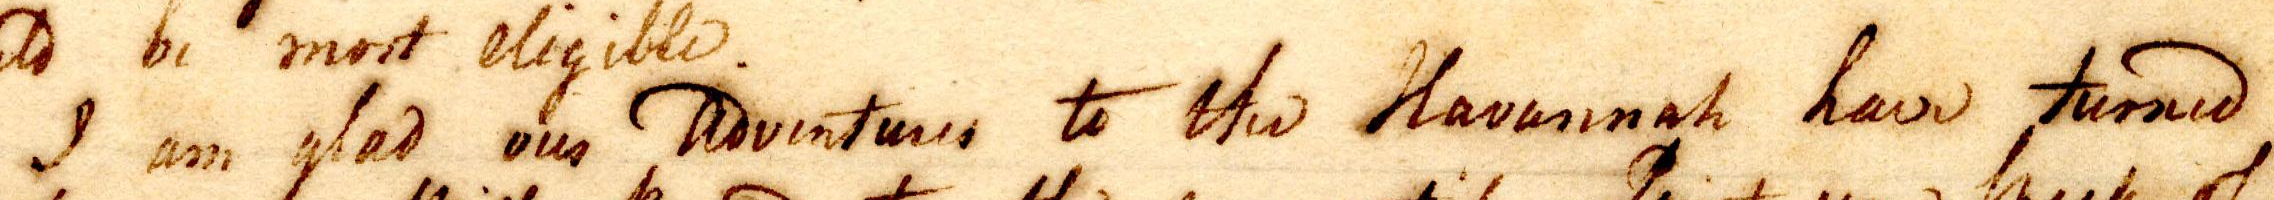I am glad our Adventures to the Havannah have turned
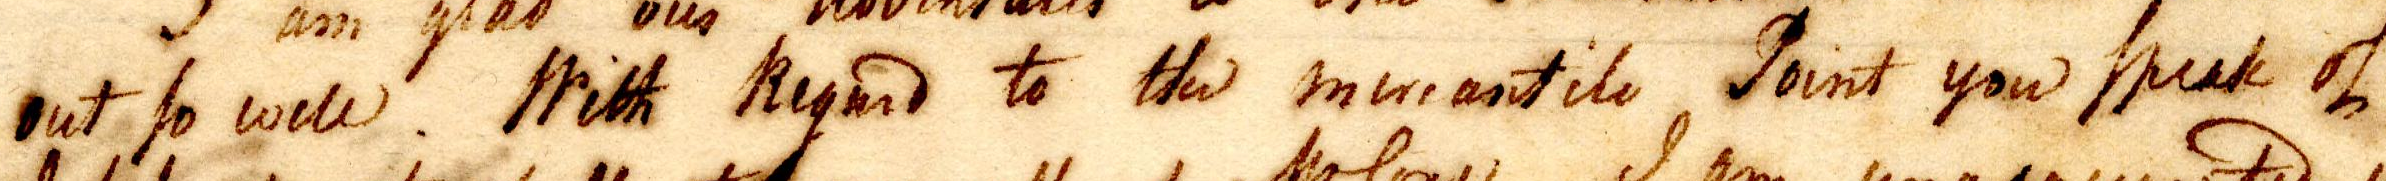out so well. With Regard to the mercantile Point you speak of
